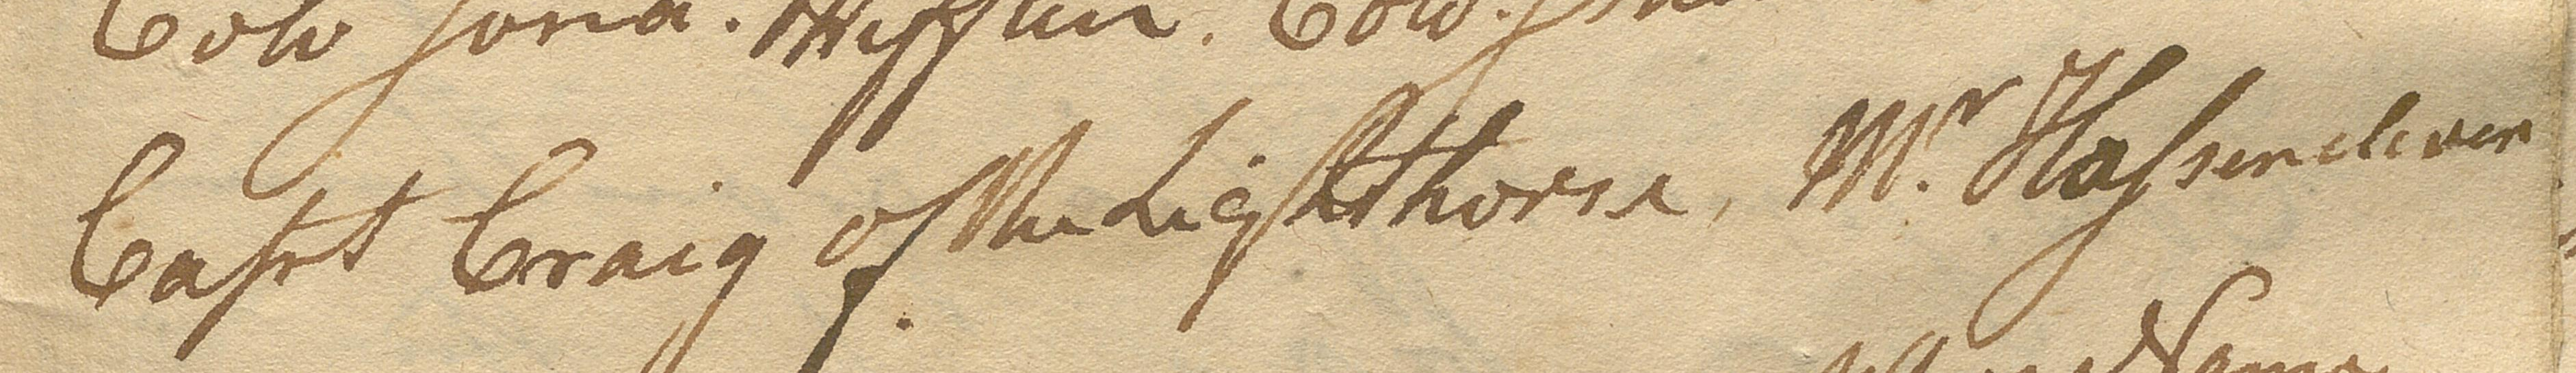Capt Craig of the Lighthorse, M^r. Hassenclever
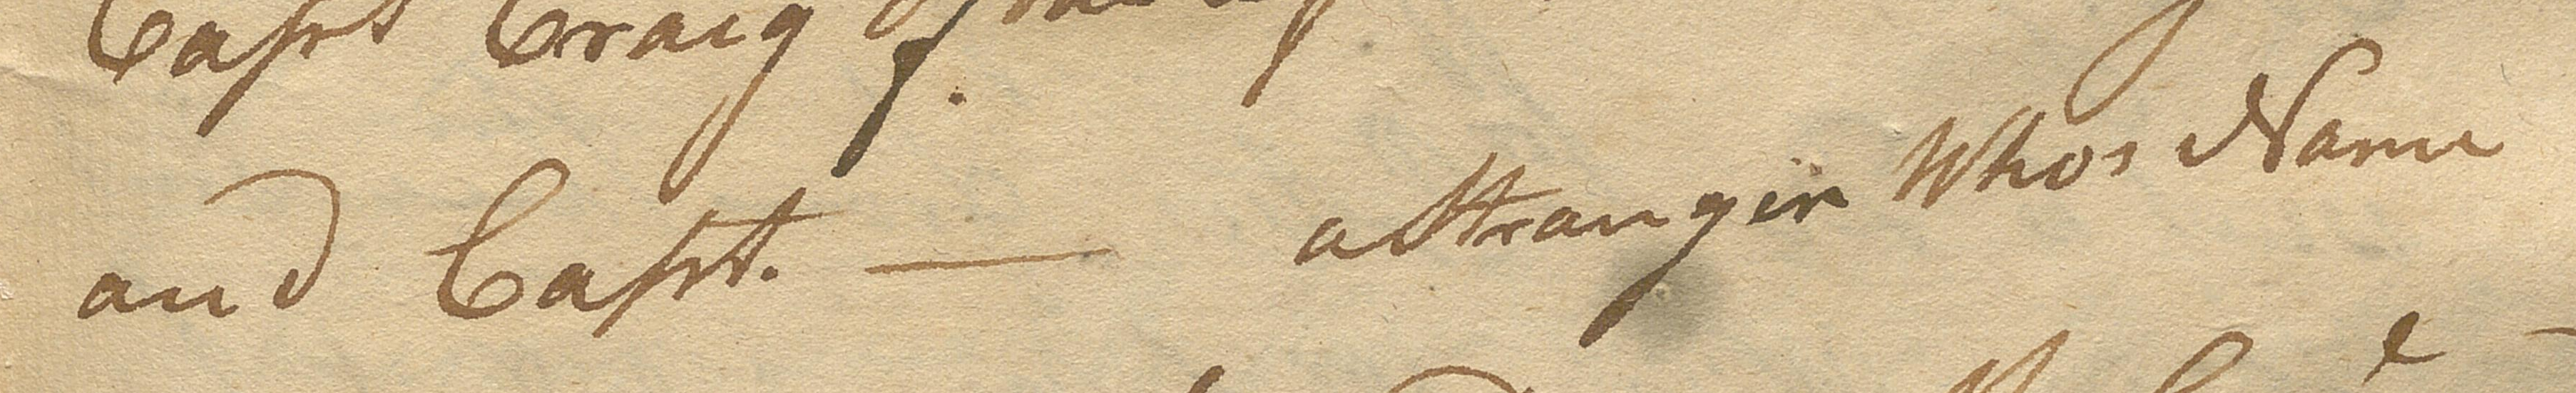and Capt.- a stranger Whos Name
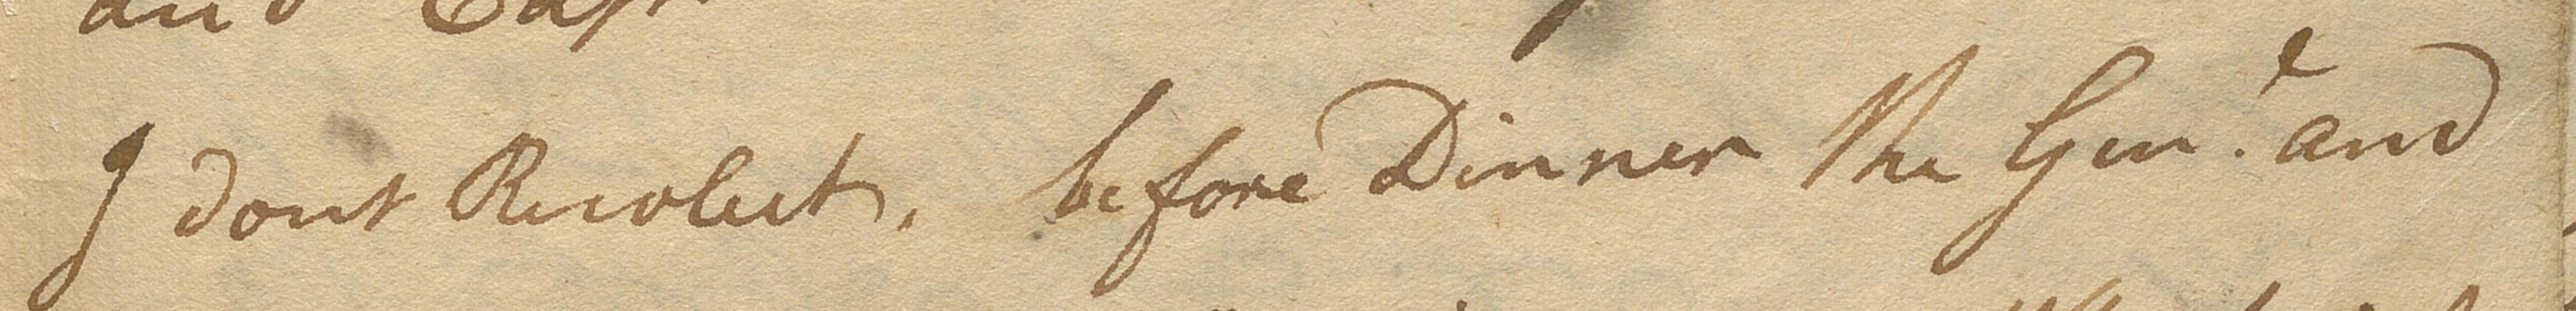I dont Recolect, before Dinner the Gen^l. and
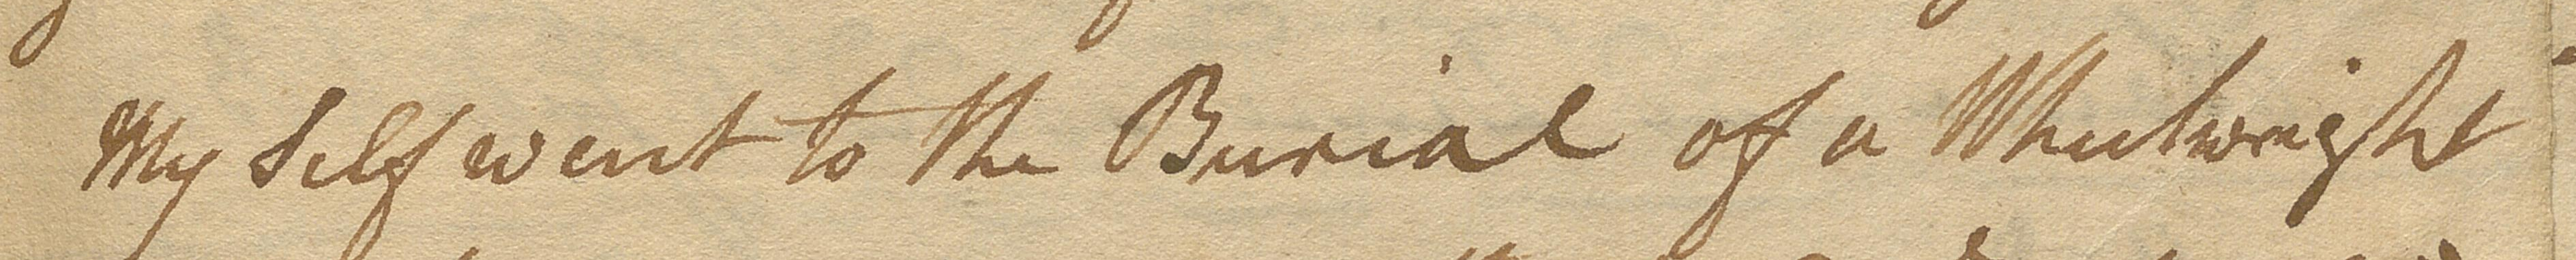My self went to the Burial of a Wheelwright
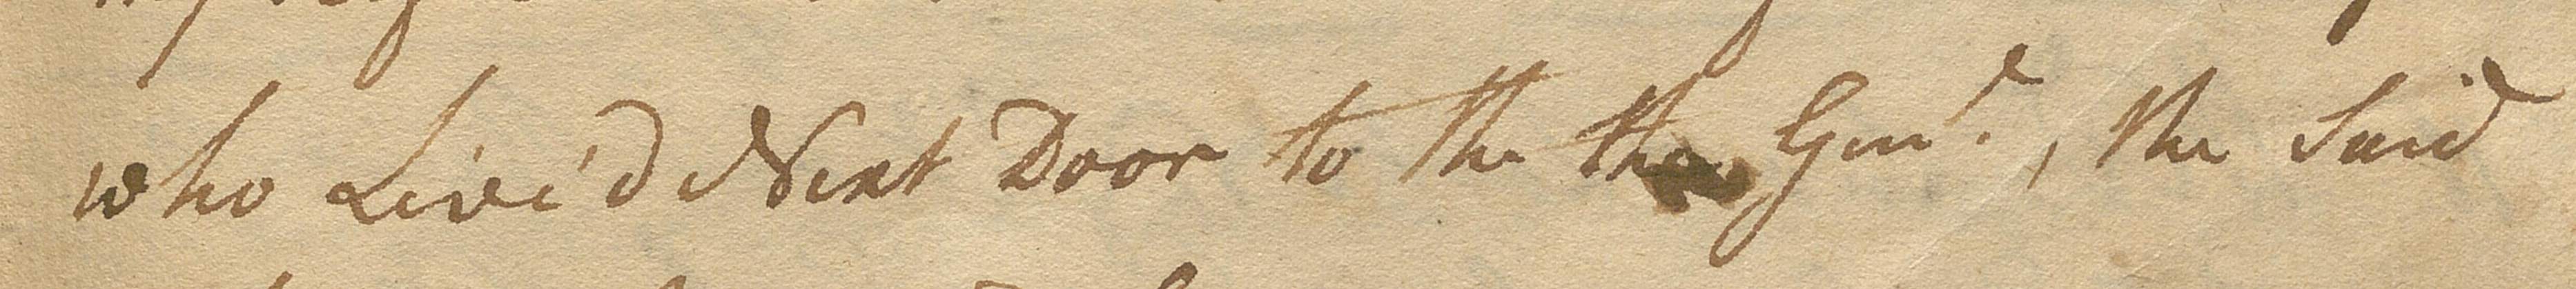who Live'd Next door to the the Gen^l., the Said
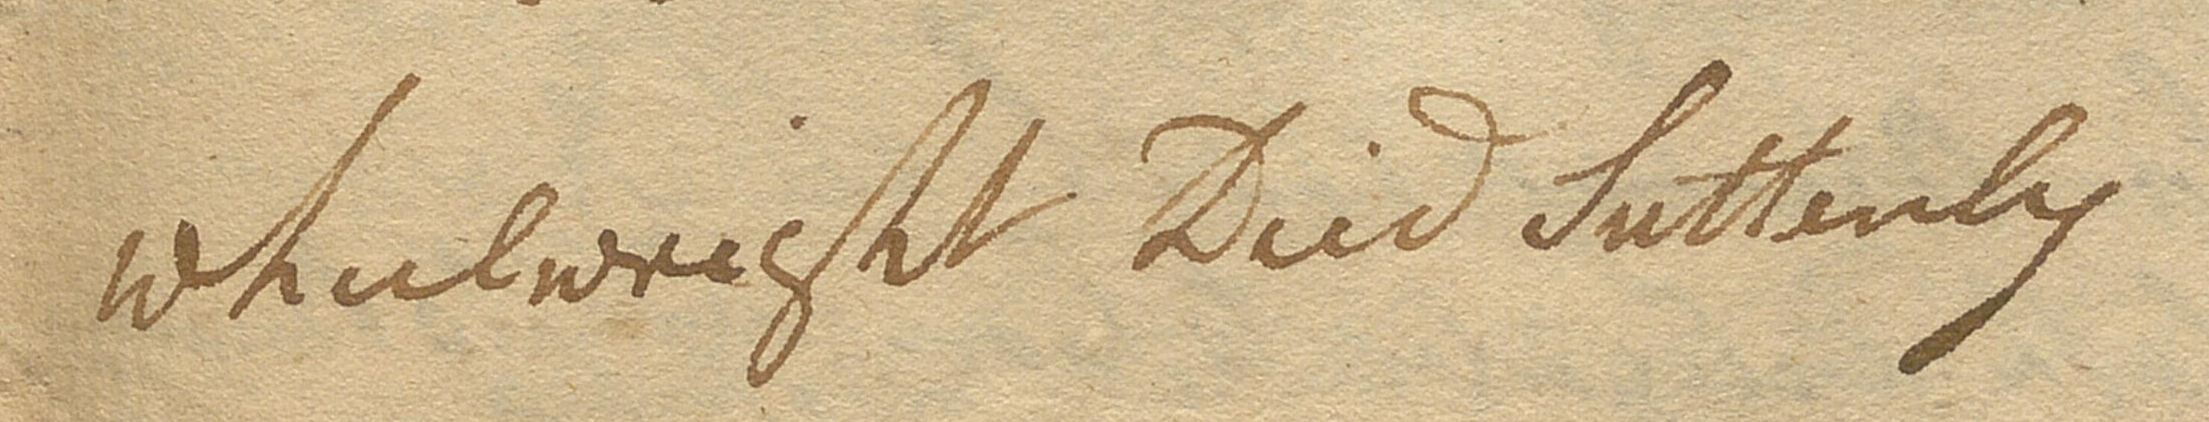wheelwright Died Suttenly
